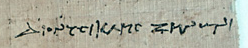διονυϲικληϲ ζηνωνι
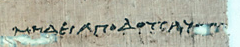μηδειαποδουϲαυτω
